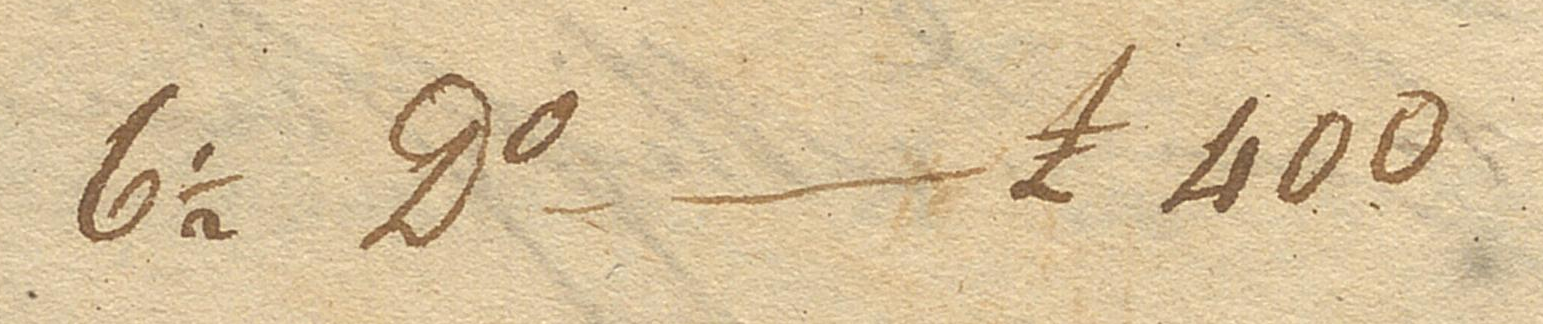6 1/2 D^o £400
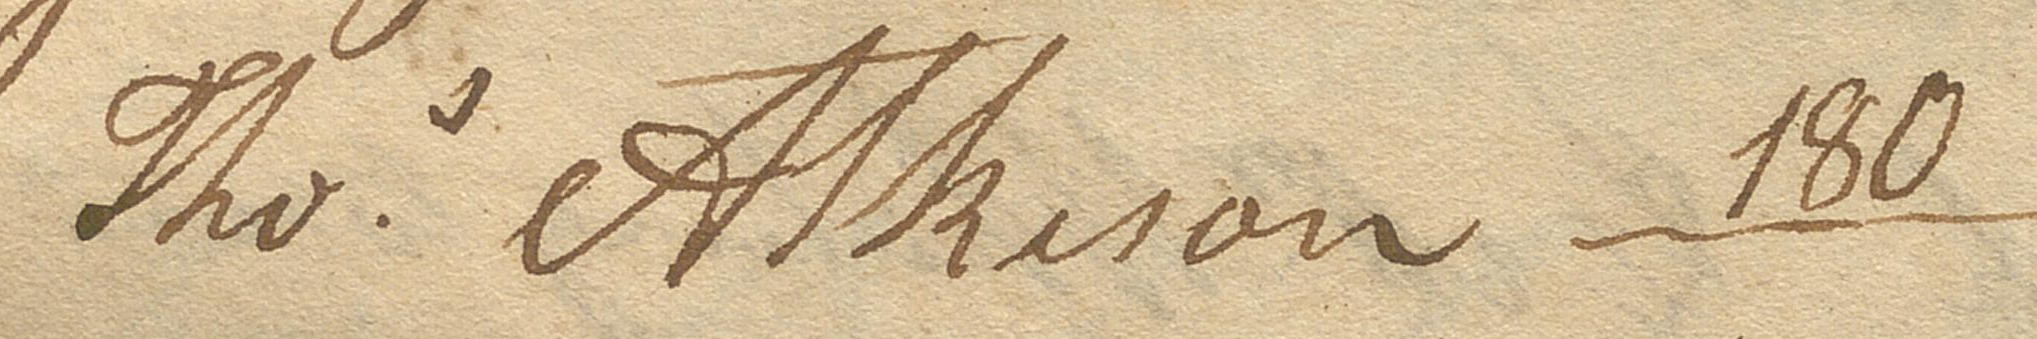Tho^s. Alkeson 180
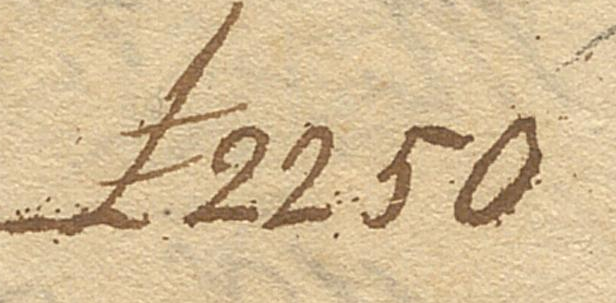£2250
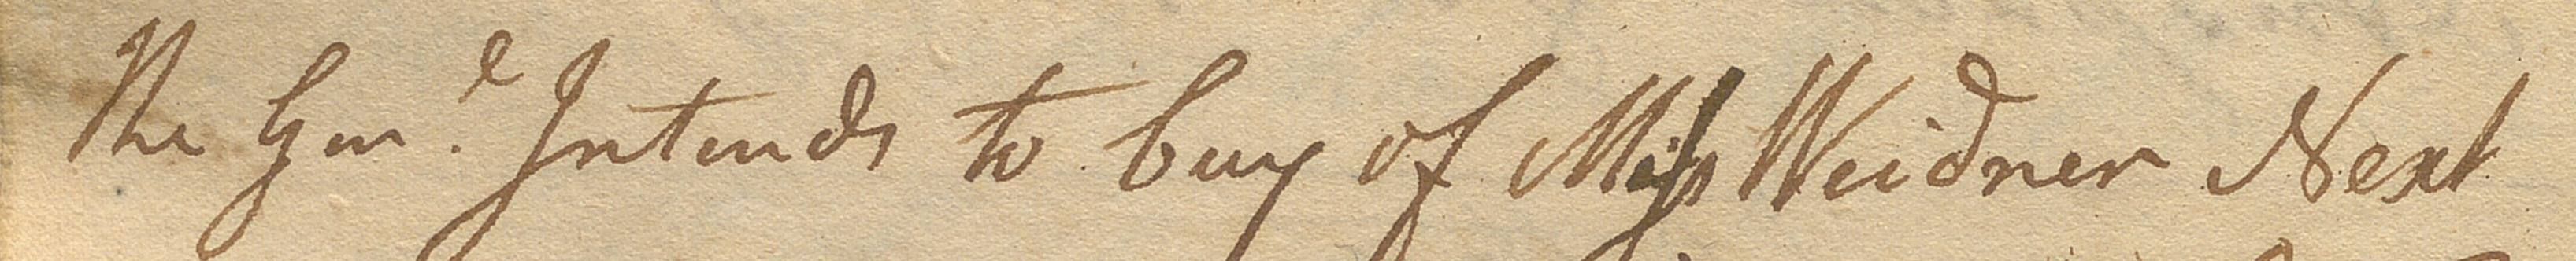the Gen^l. Intends to buy of Miss Weidner Next
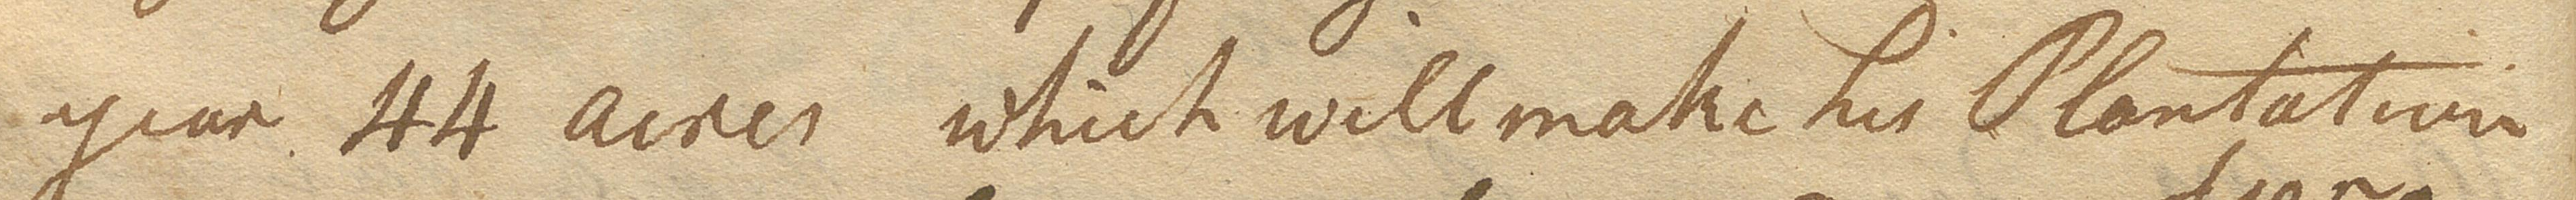year 44 acres which will make his Plantation
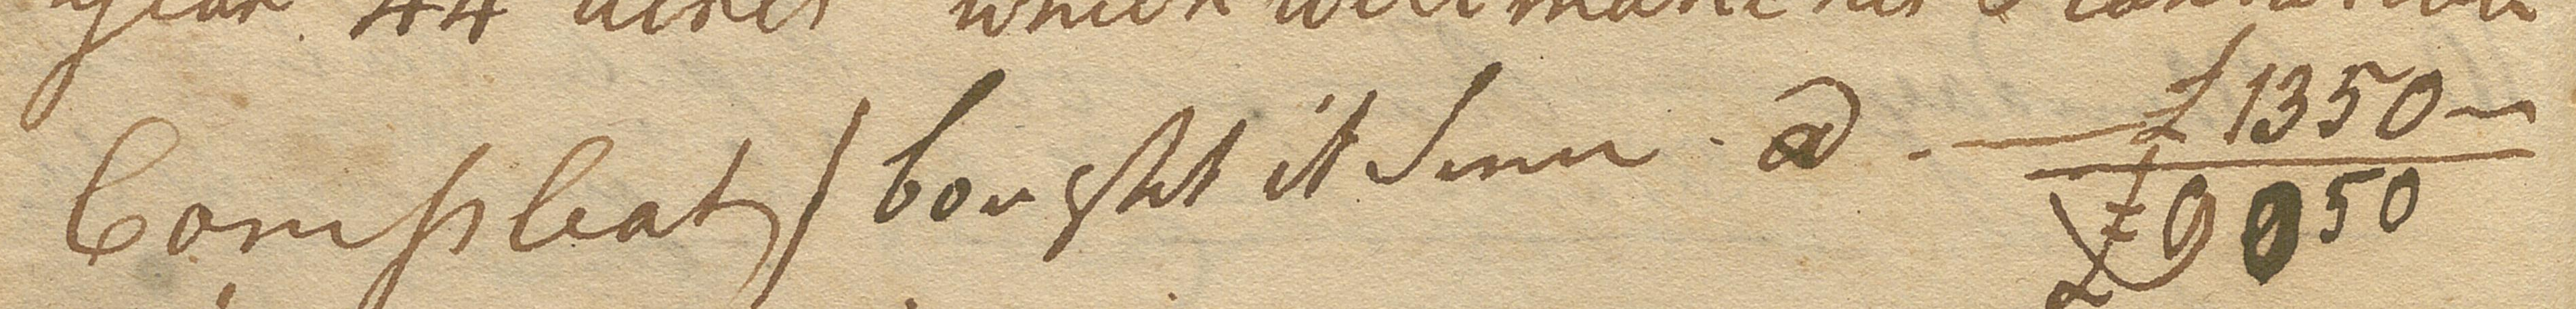Compleat / bought it Since @ £1350-
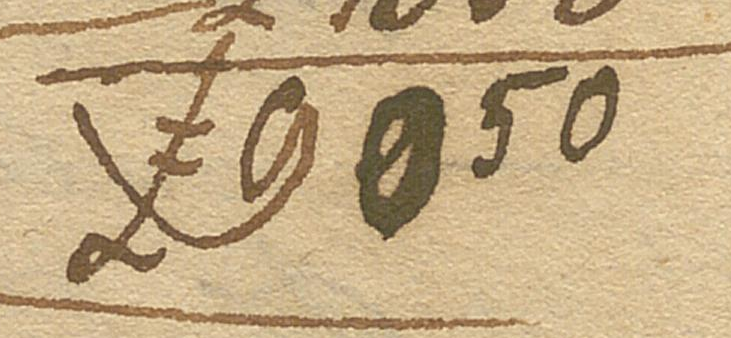£9050
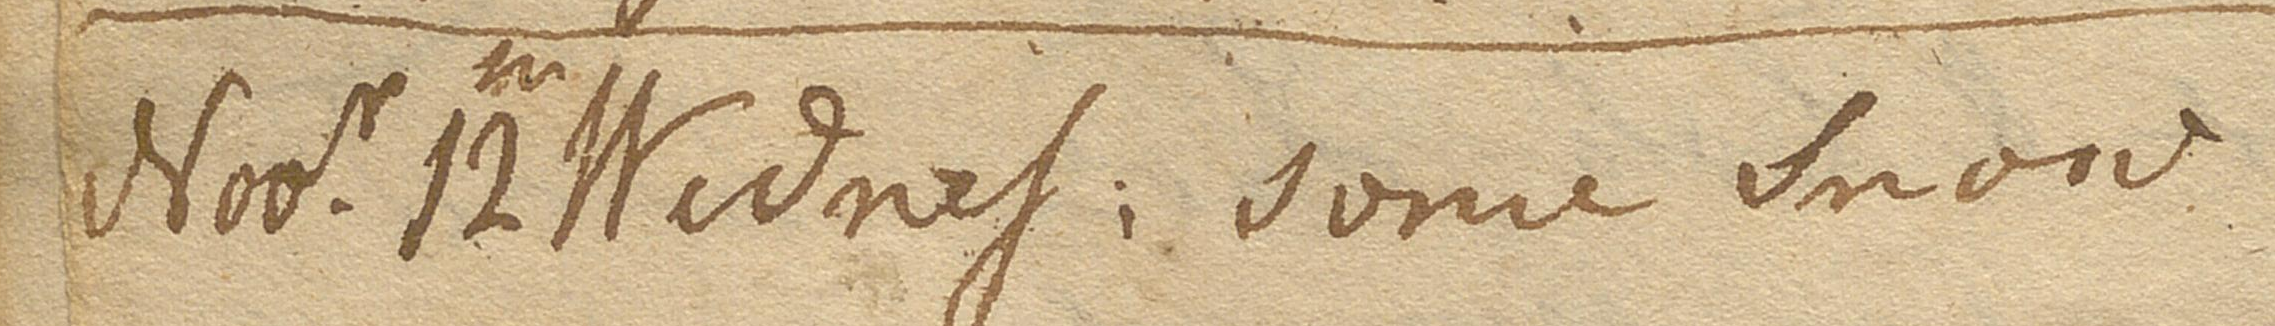Nov^r. 12^th Wednes. some snow
